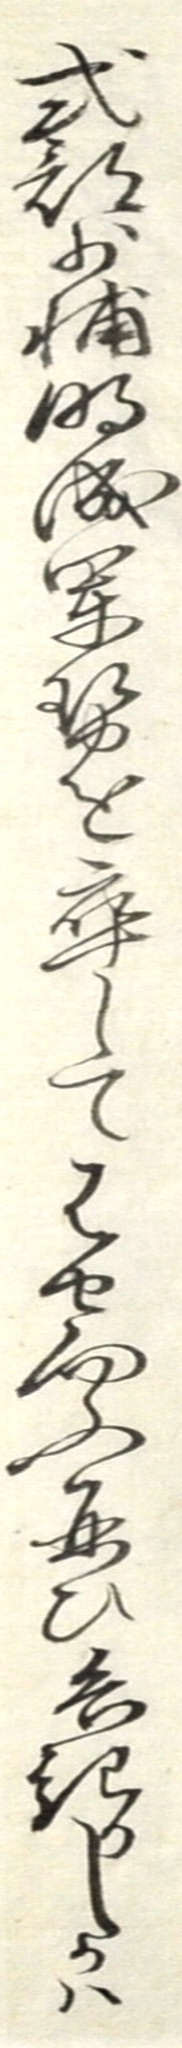式部少輔明成闌勢を率してはせ向ふ再ひ兵起りしかは
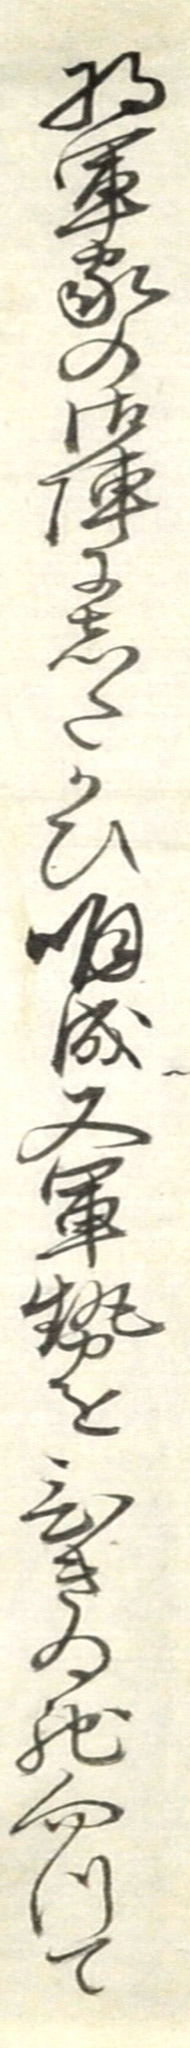将軍家の御陣にしたかひ明成又軍勢をひきゐ馳向つて
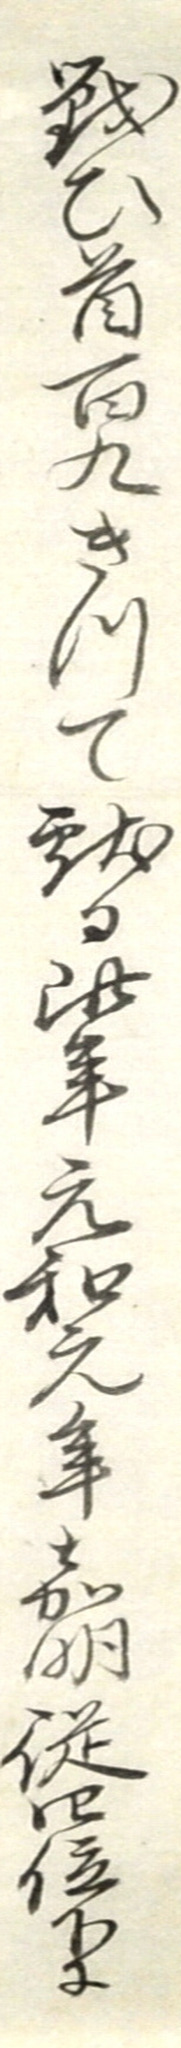戦ひ首百九きつて献る此年元和元年嘉明従四位下に
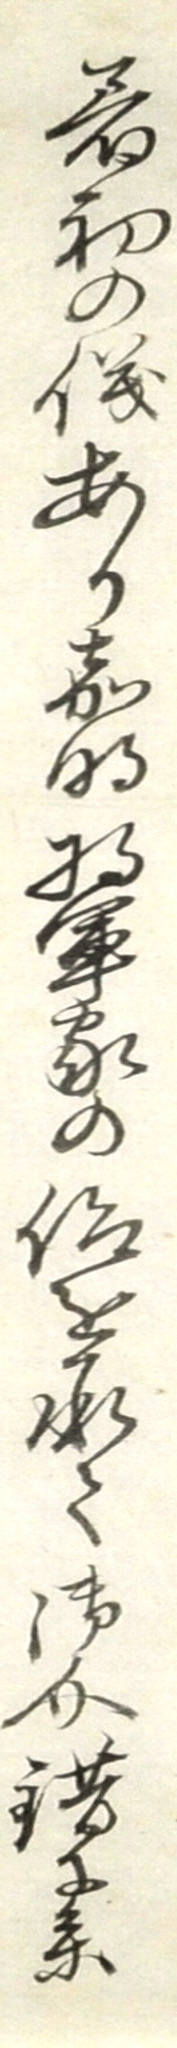着初の儀あり嘉明将軍家の仰を承て御介錯に参
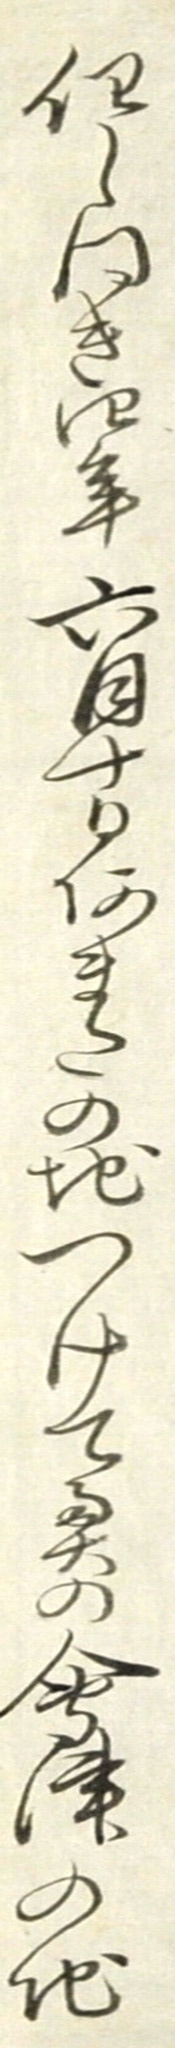任し同き四年六月十日あまたの地つけて奥の会津の地

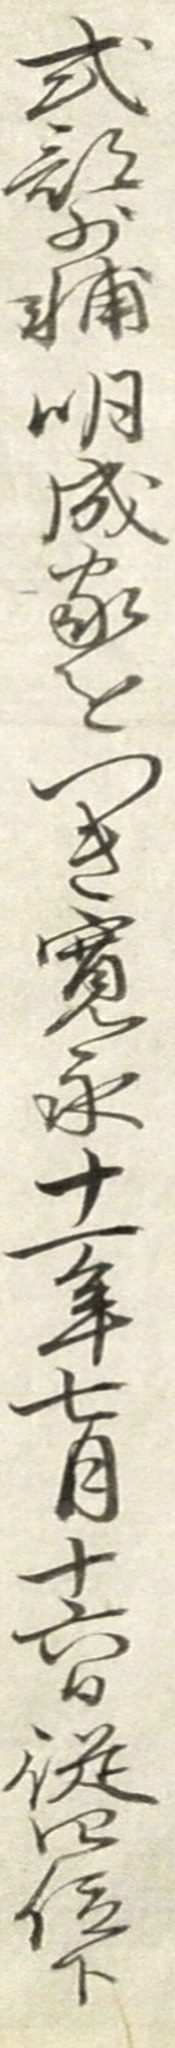式部少輔明成家をつき寛永十一年七月十六日従四位下
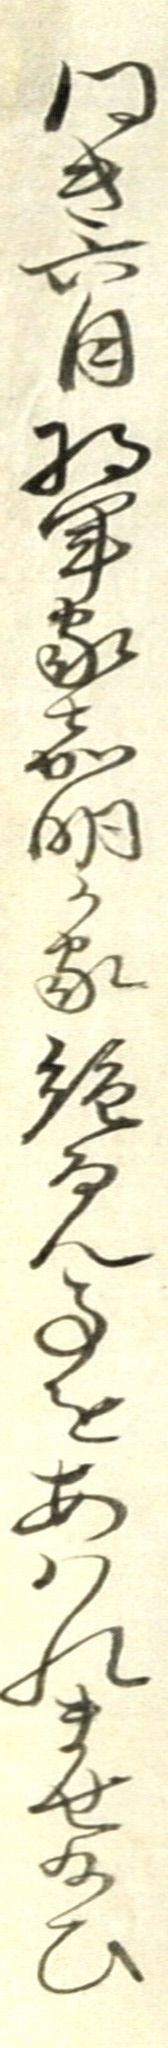同き六月将軍家嘉明か家絶なん事をあはれませ給ひ

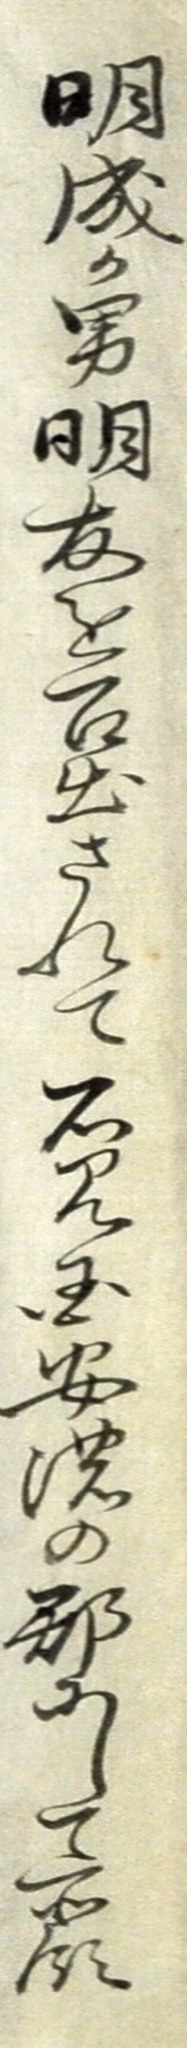明成か男明友を召出されて石見国安濃の郡にして所領
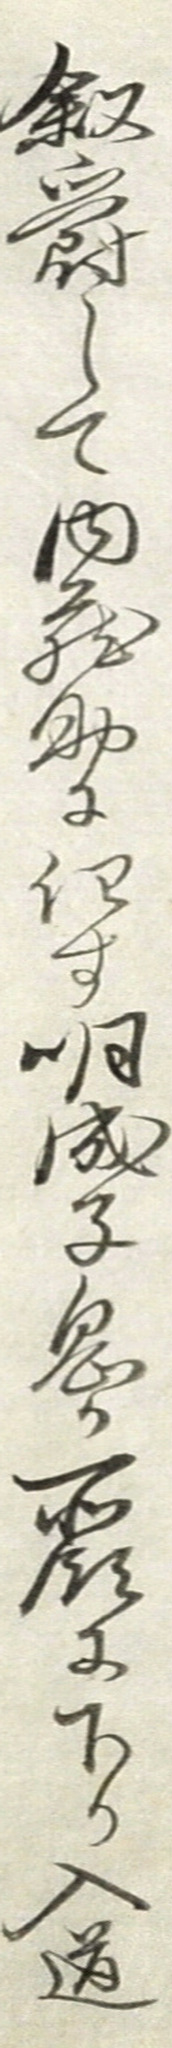叙爵して内蔵助に任す明成子息か所領に下り入道
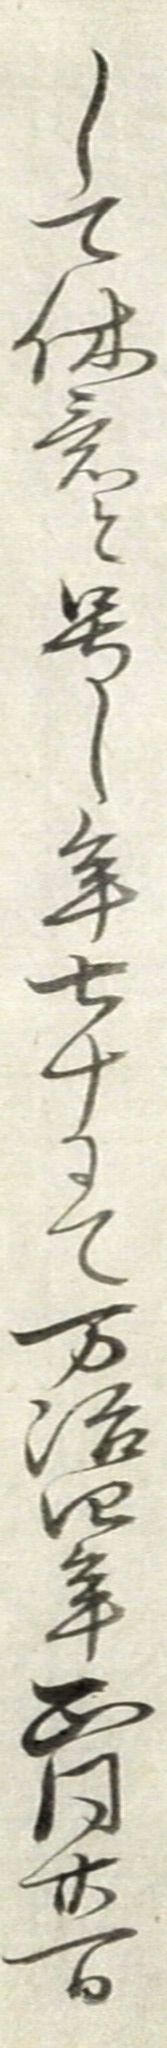して休意と号し年七十にて万治四年正月二十一日
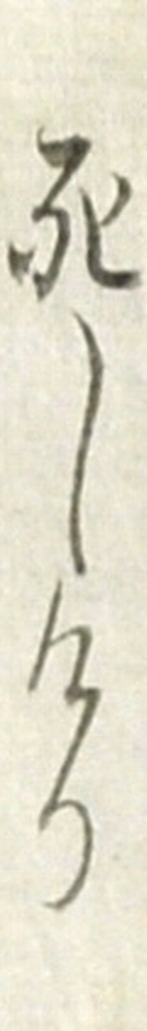死しけり
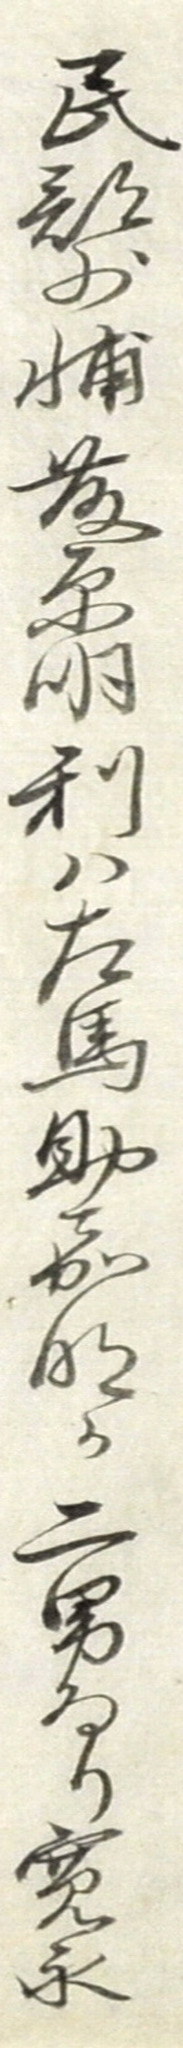民部少輔藤原明利は左馬助嘉明か二男なり寛永
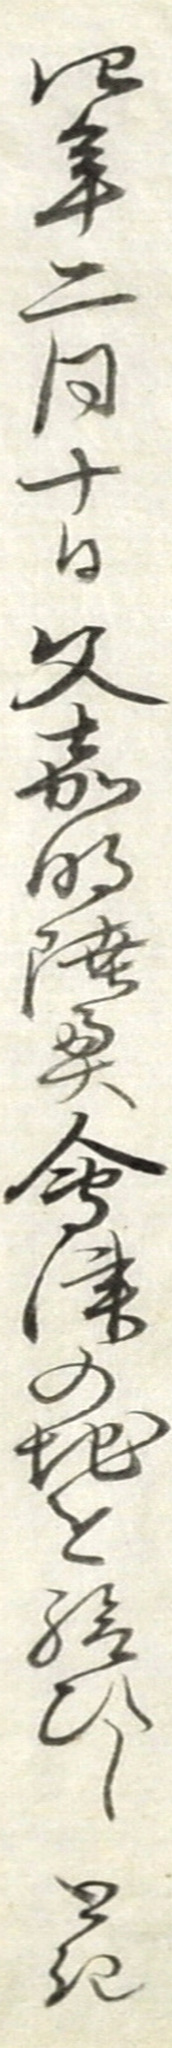四年二月十日父嘉明陸奥会津の地を給ひしとき
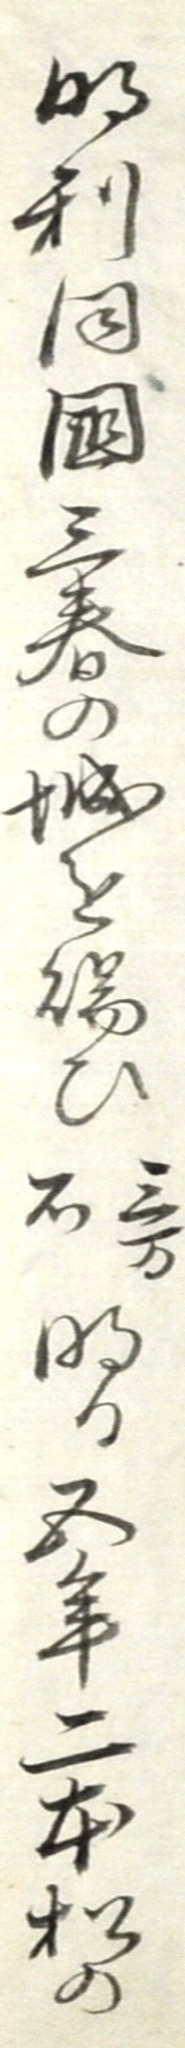明利同国三春の城を賜ひ三万石明る五年二本松の

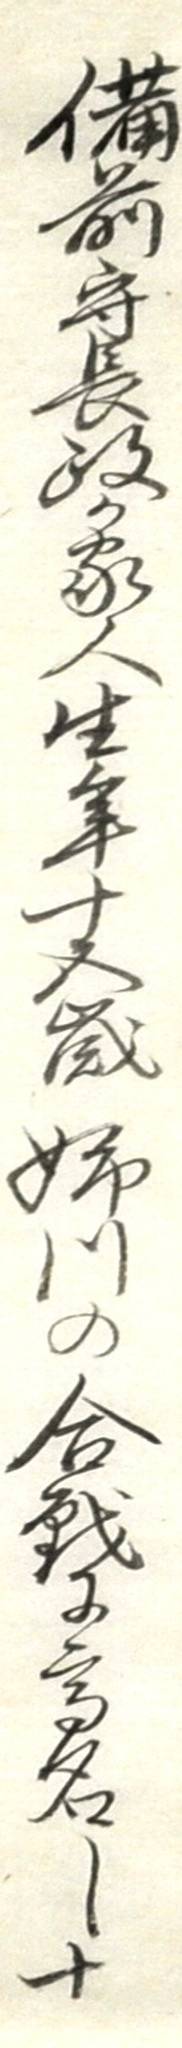備前守長政か家人生年十五歳姉川の合戦に高名し十
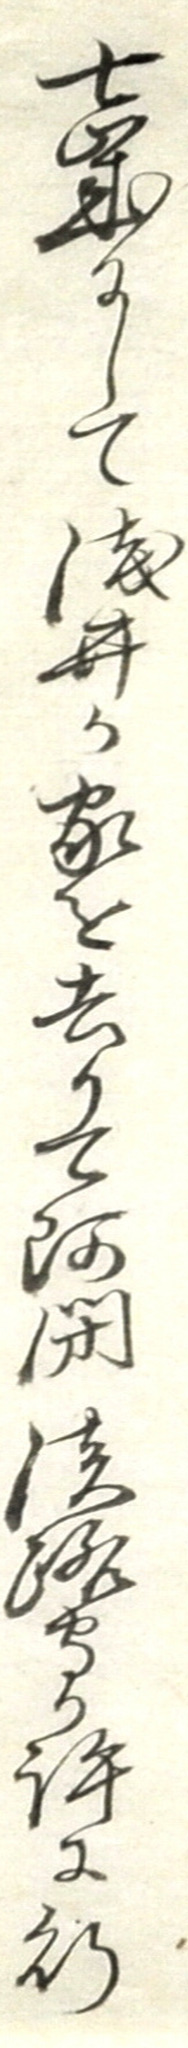七歳にして浅井か家を去りて阿閉淡路守か許に行
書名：藩翰譜（七・下）
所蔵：伊那市立高遠町図書館・合同会社AMANE
